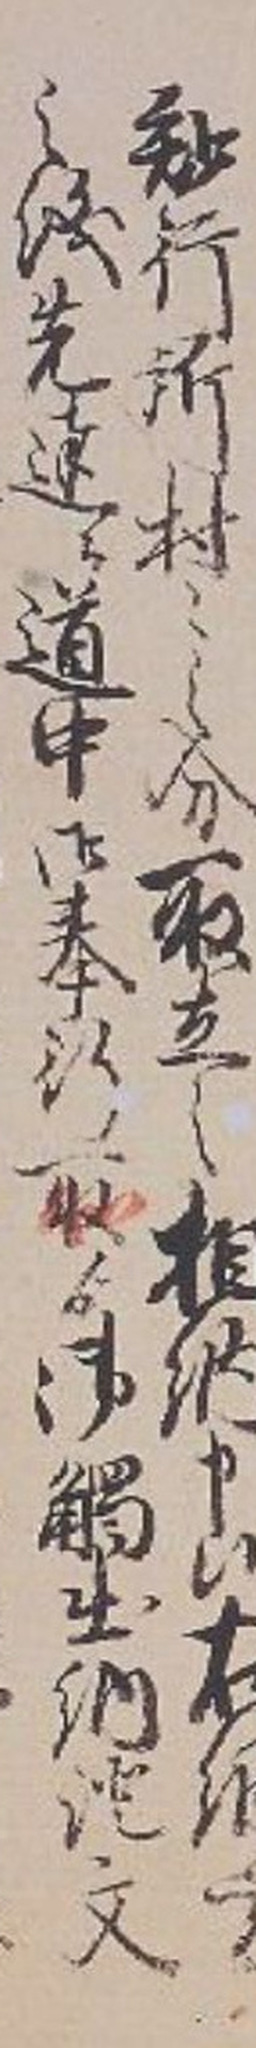之儀先達而道中御奉行所ゟ御出納証文
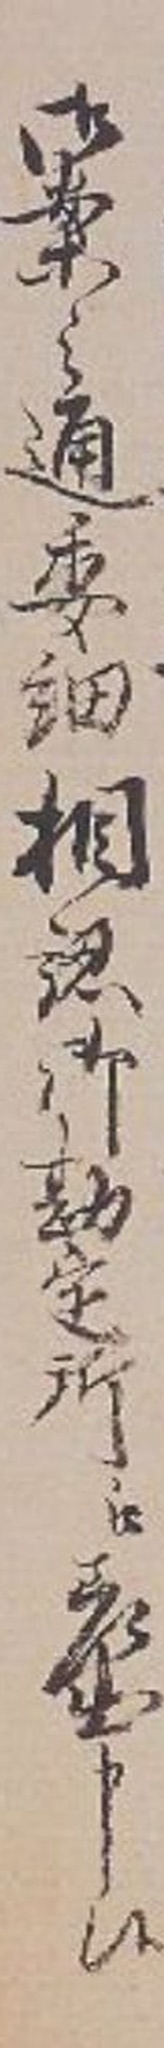御案之通委細相認御勘定所え差出申候
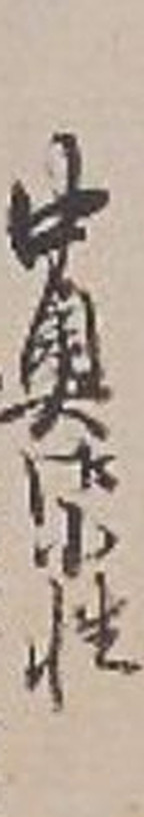中奥御小性
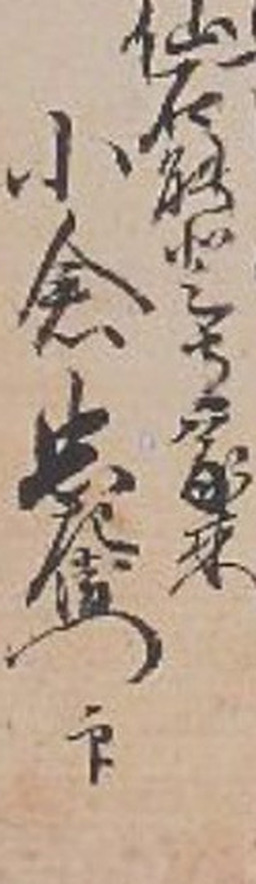小倉忠左衛門印

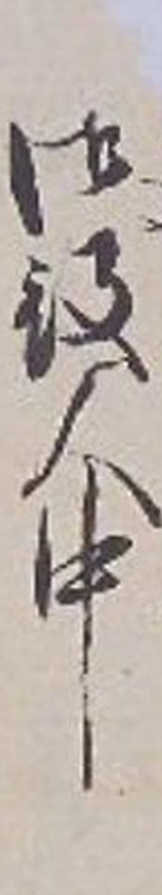御役人中
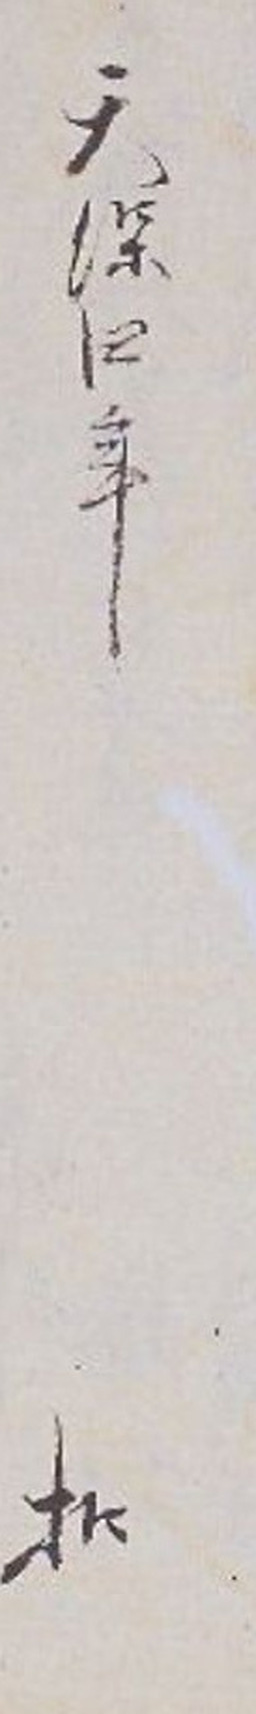天保四年扣
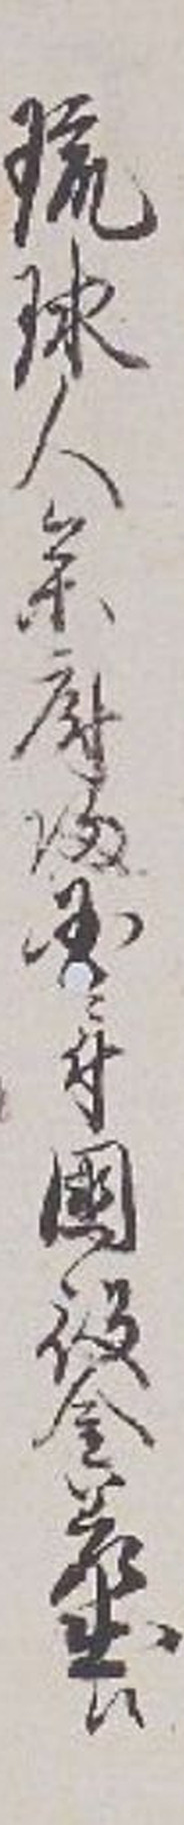琉球人参府帰国に付国役金差出候
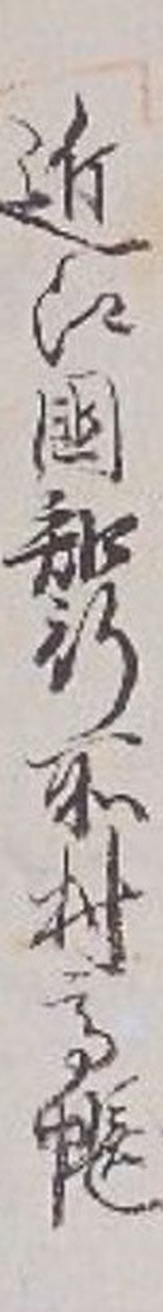近江国知行所村高丁帳
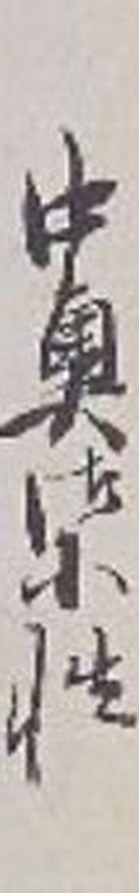中奥御小性
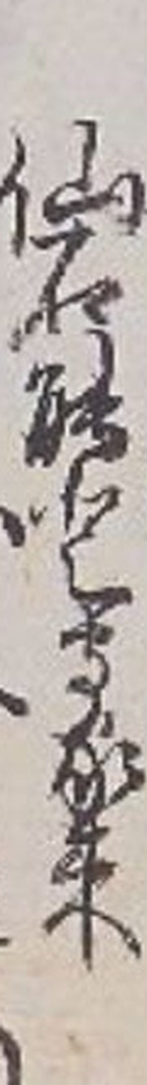仙石能登守家来

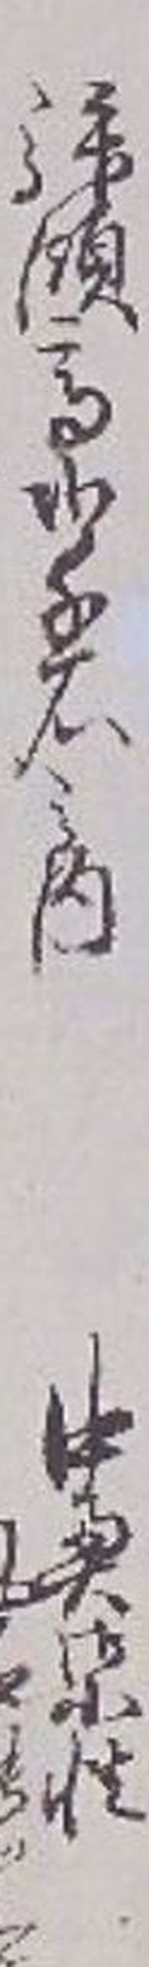拝領高弐千石之内中奥御小性
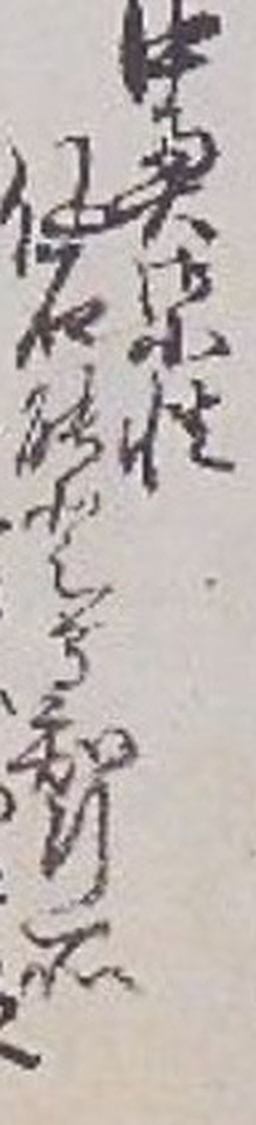仙石能登守知行所
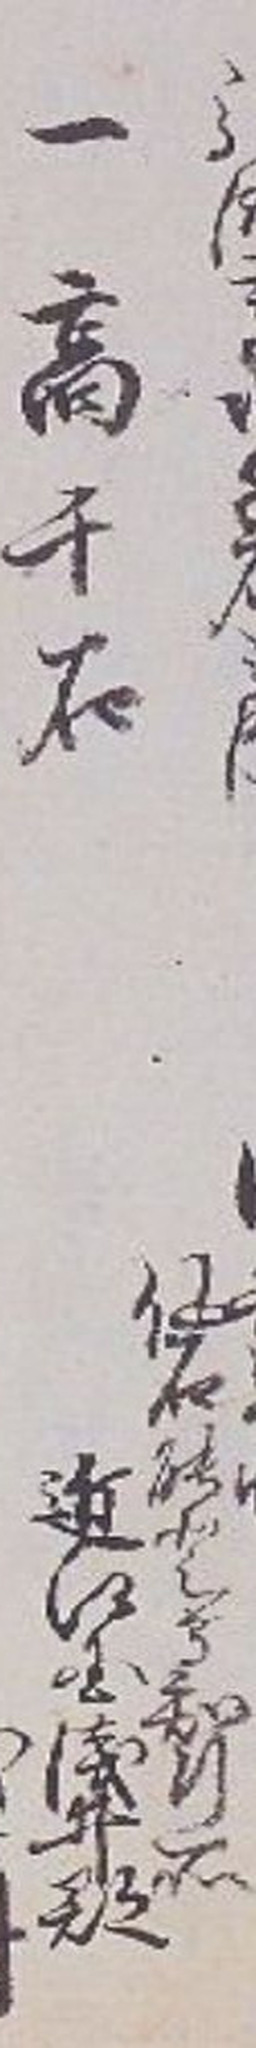一高千石近江国浅井郡
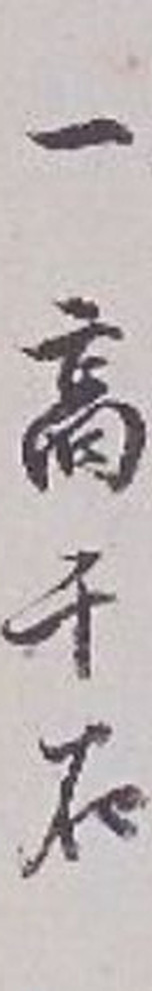合高千石
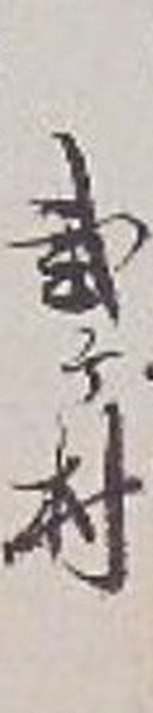弐ヶ村
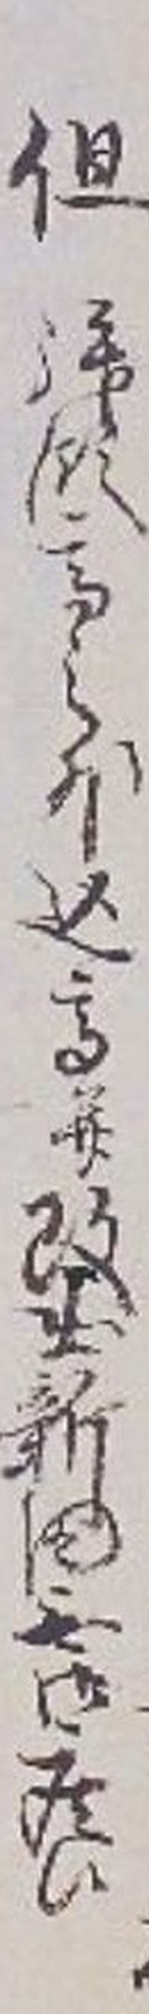但拝領高之外込高幷改出新田無御座候
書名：琉球人帰国に付国役金の記録
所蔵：University of the Ryukyus Library
